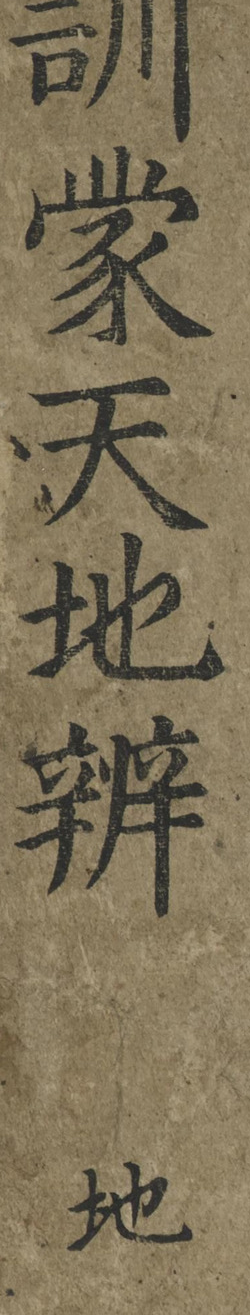訓蒙天地辨地

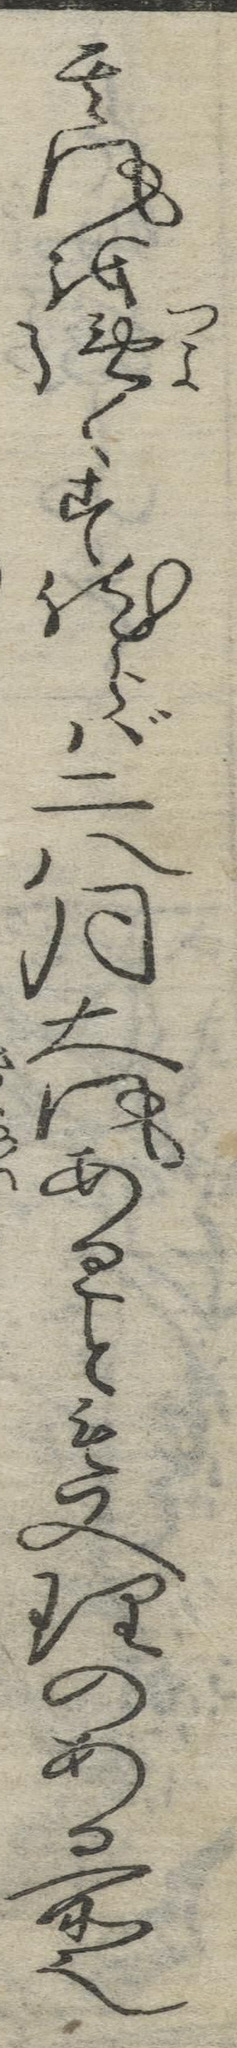其風を強くす然らバ二八月大風あることも又理のある所也
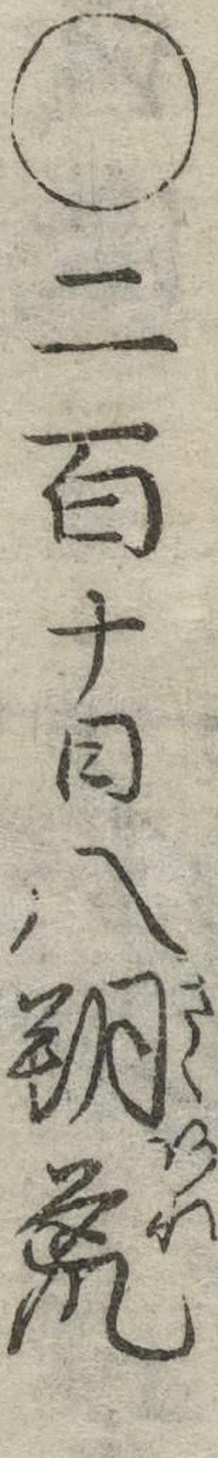〇二百十日八朔荒
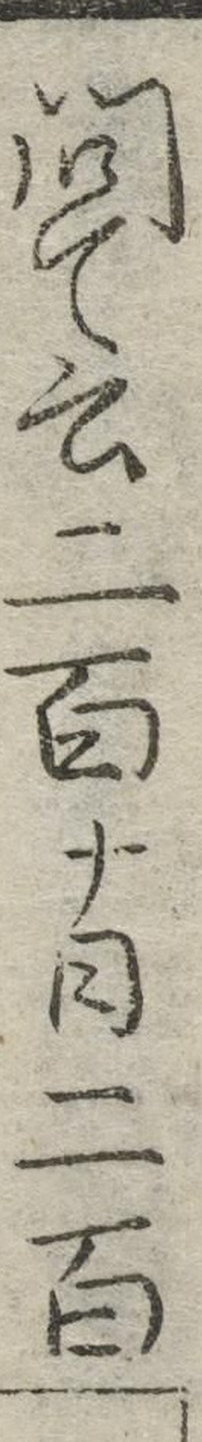問て云二百十日二百
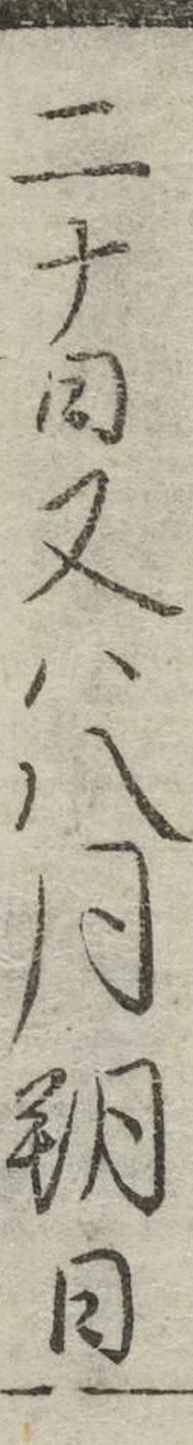二十日又ハ八月朔日
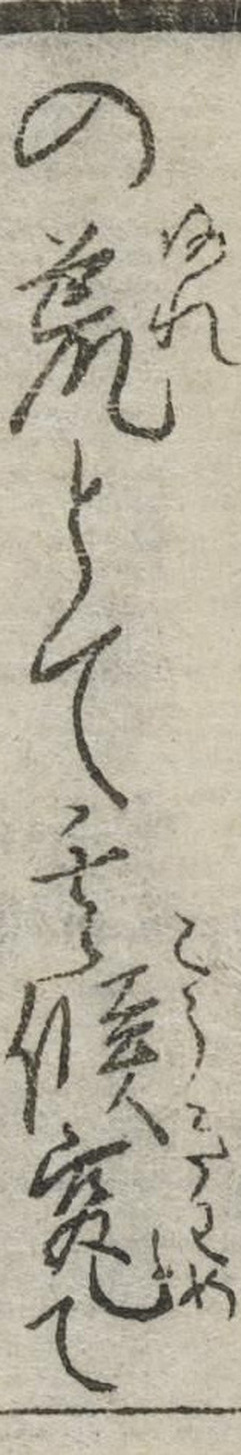の荒とて其候究て
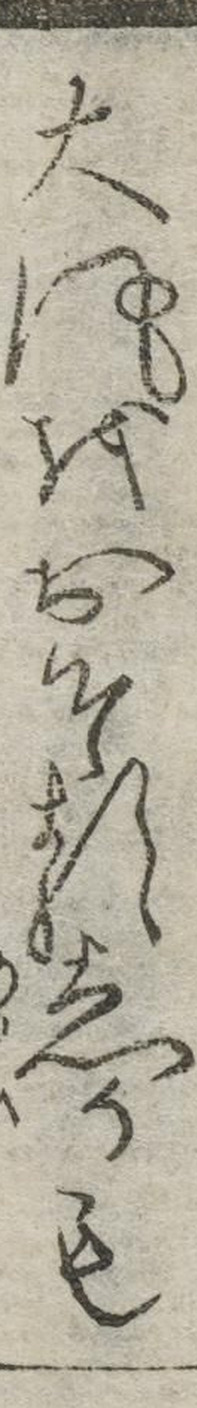大風をおそるしかも
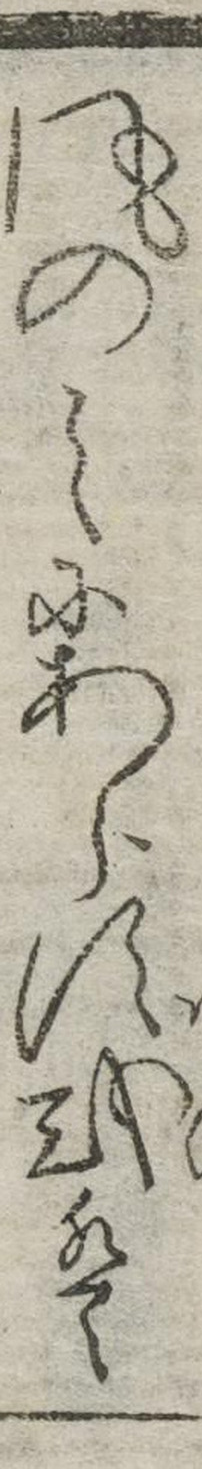風のミにあらす或は
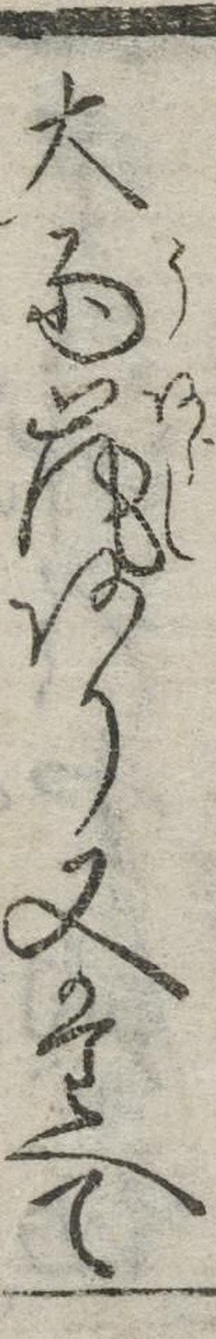大雨嵐あり又たへて
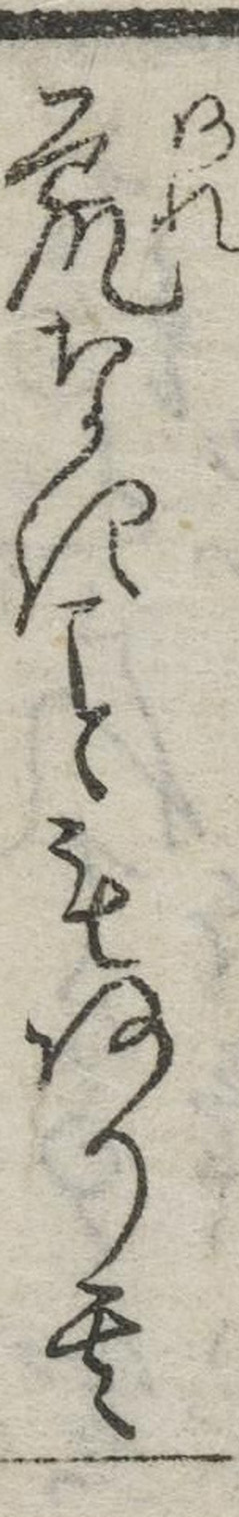荒なきこともあり其
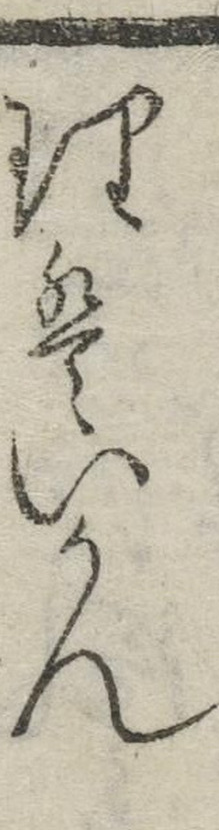理はいかん
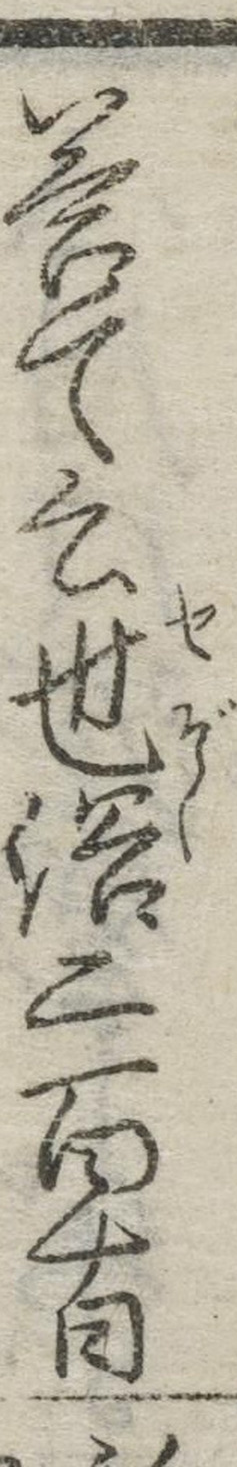答て云世俗二百十日
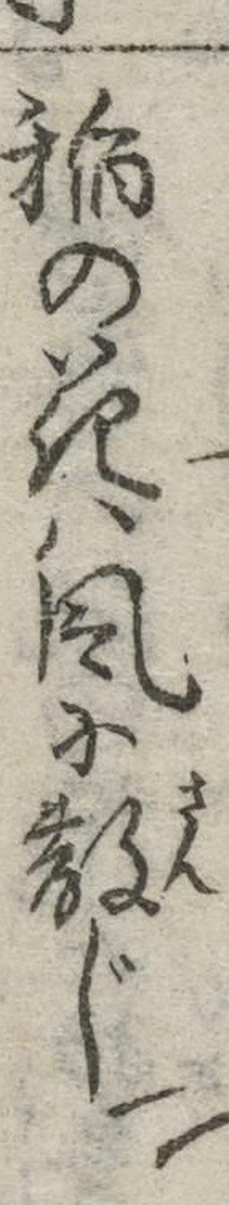稲の花ハ風に散じ
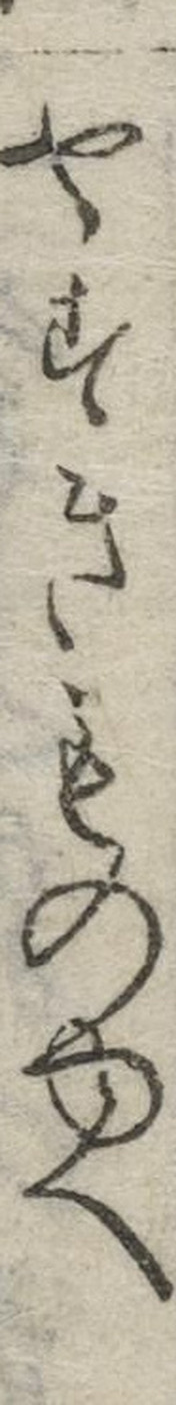やすきものゆへ
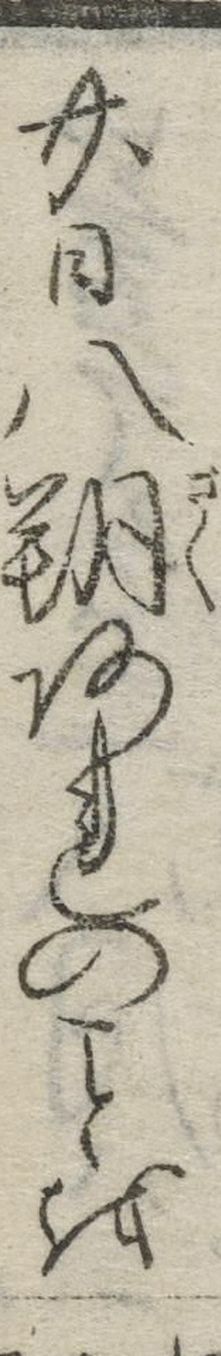廿日八朔あれのことを
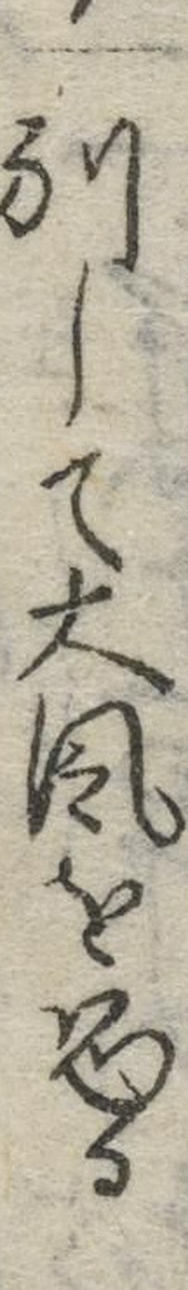別して大風を恐る
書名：訓蒙天地辨　地
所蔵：東京大学地震研究所図書室 Earthquake Research Institute Library, The University of Tokyo, JAPAN
